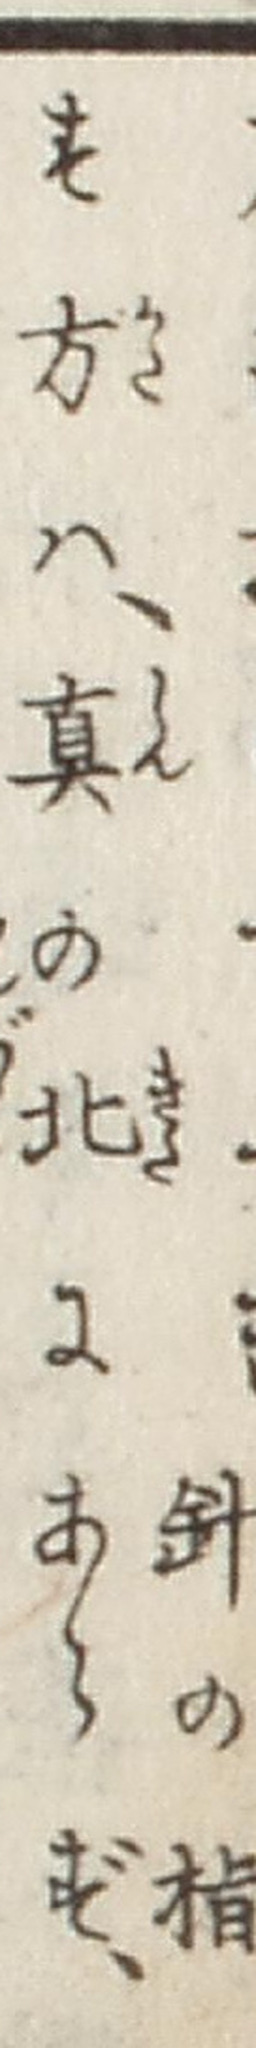す方は、真の北にあらず、
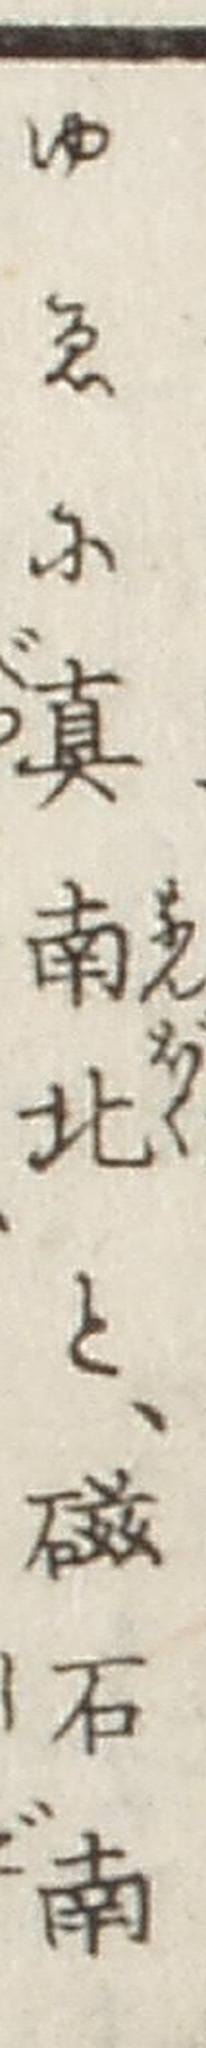ゆゑに真南北と、磁石南
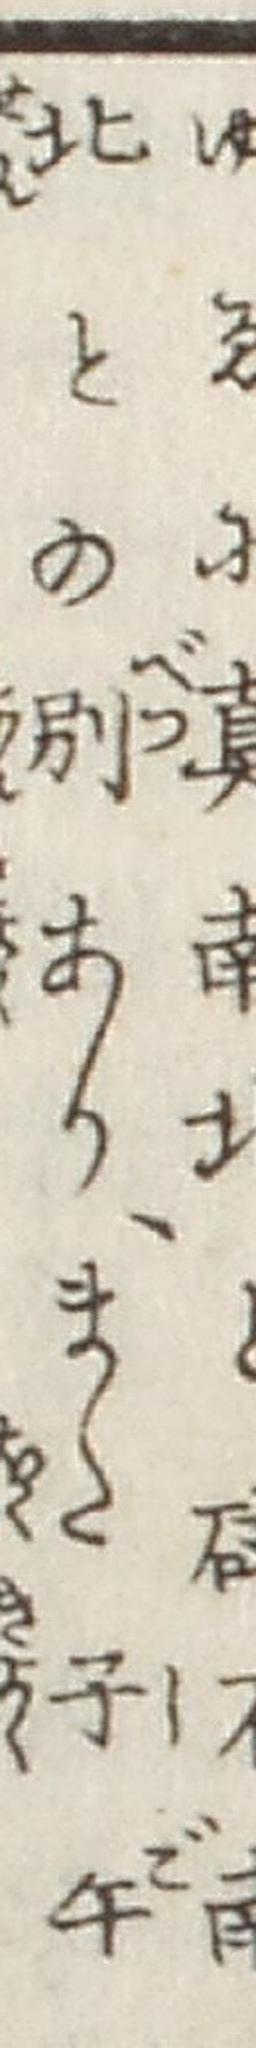北との別あり、また子午
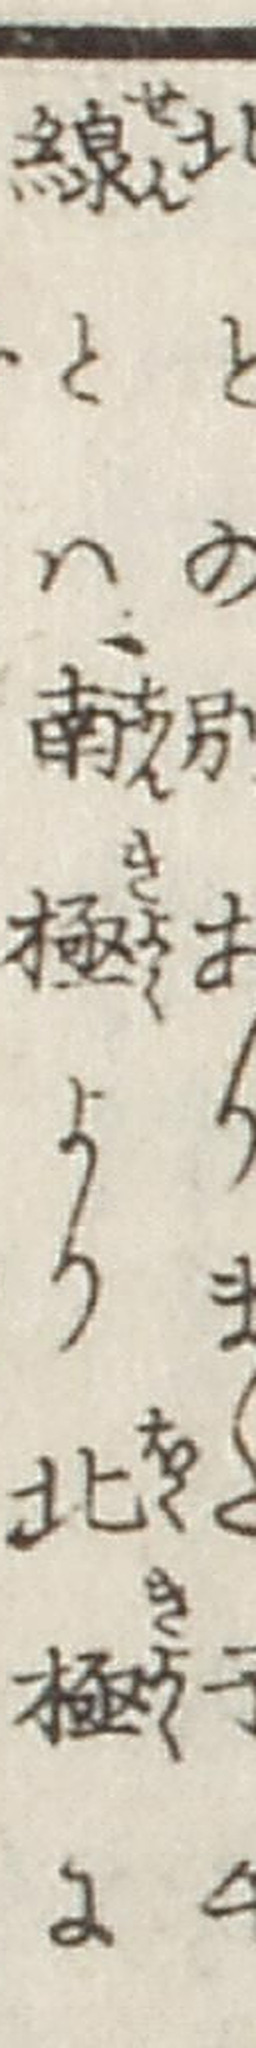線とは、南極より北極に
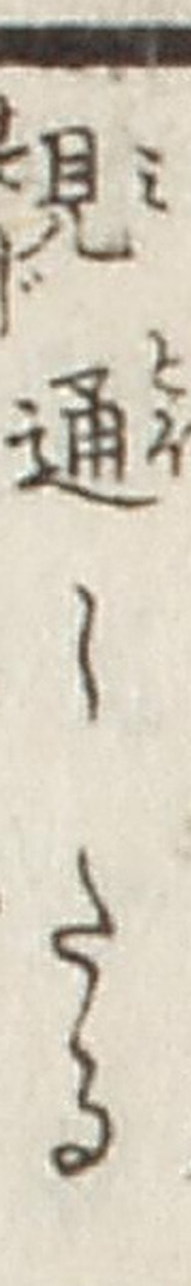見通したる
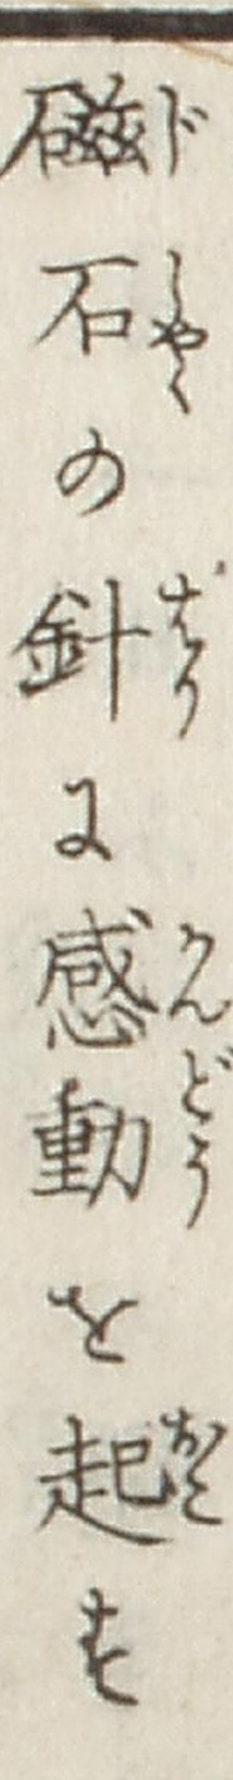磁石の針に感動を起す
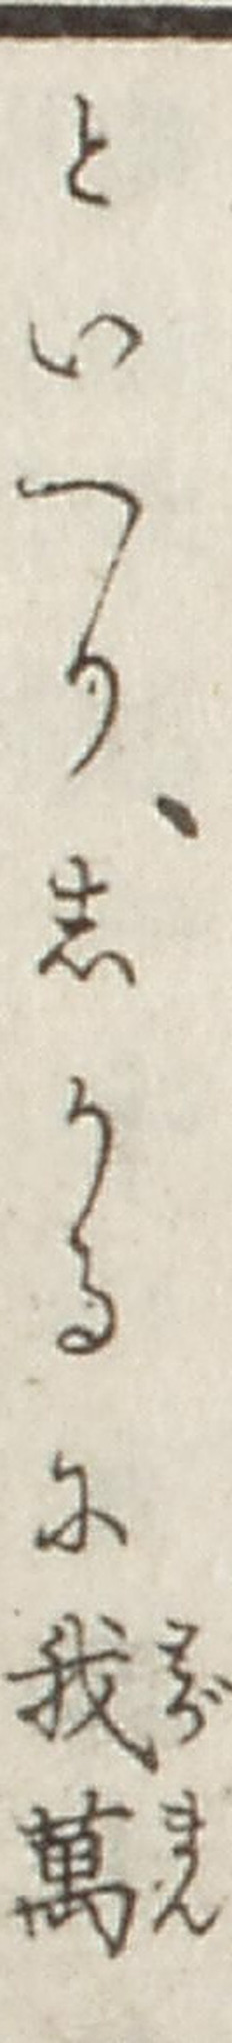といへり、しかるに我萬

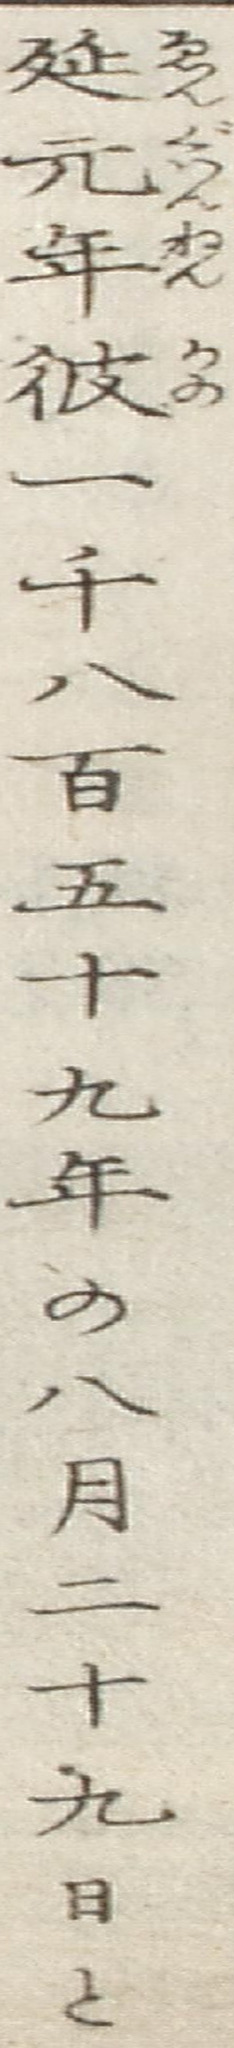延元年彼一千八百五十九年の八月二十九日と
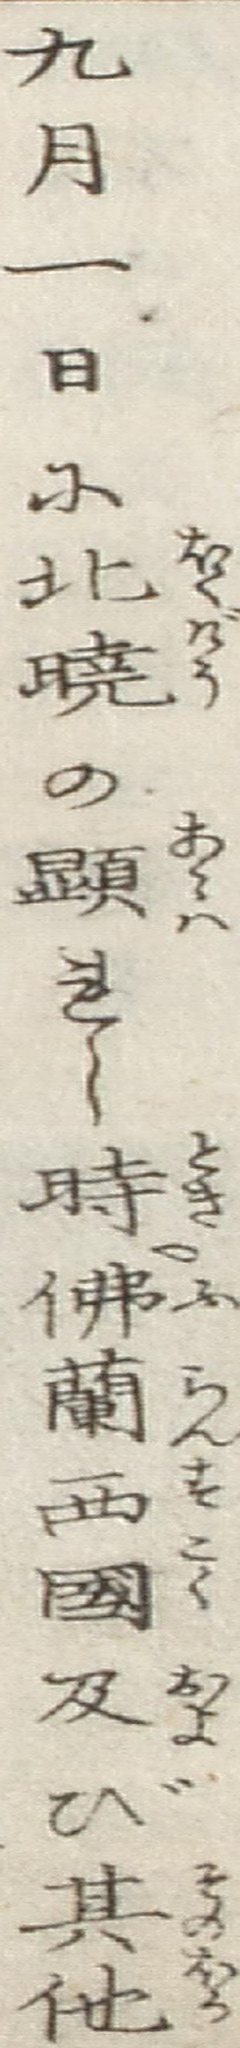九月一日に北暁の顕れし時。仏蘭西国及び其他
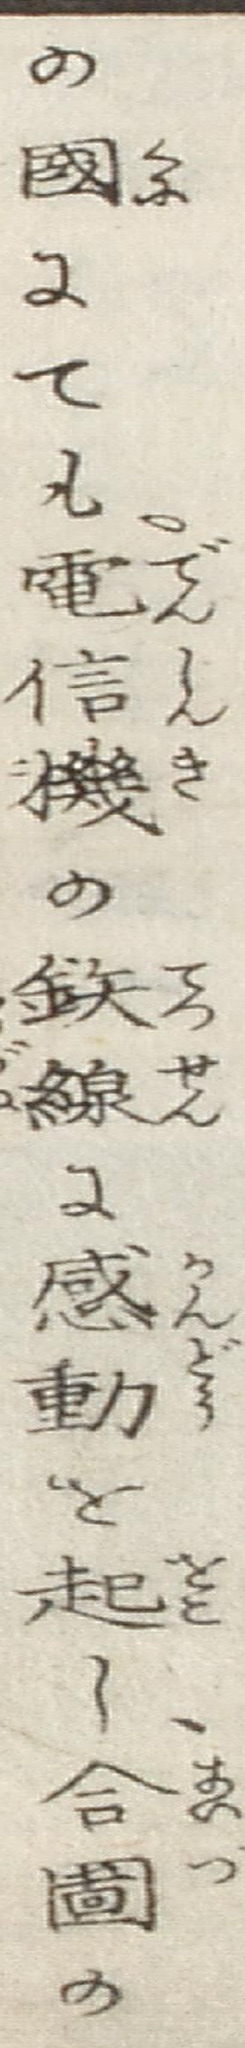の国にても。電信機の鉄線に感動を起し、合図の
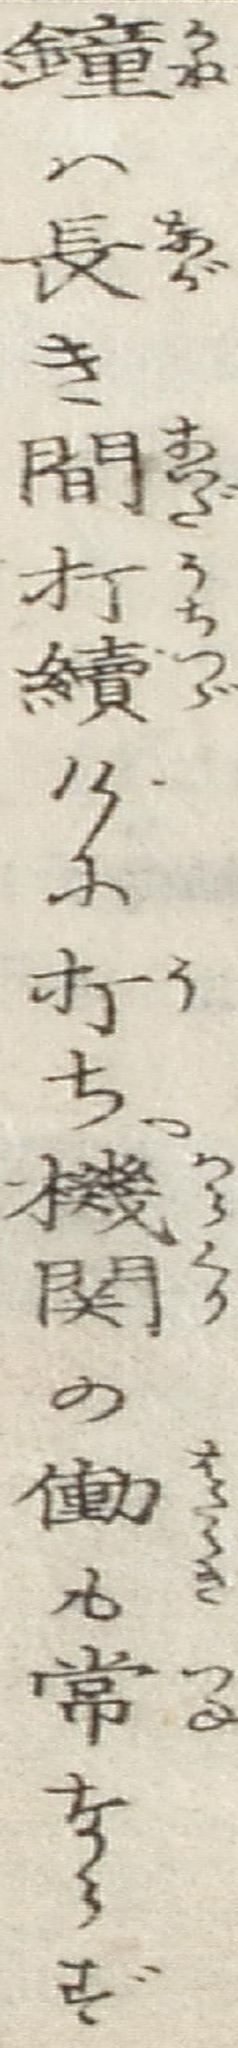鐘は長き間打続けに打ち。機関の働も常ならず
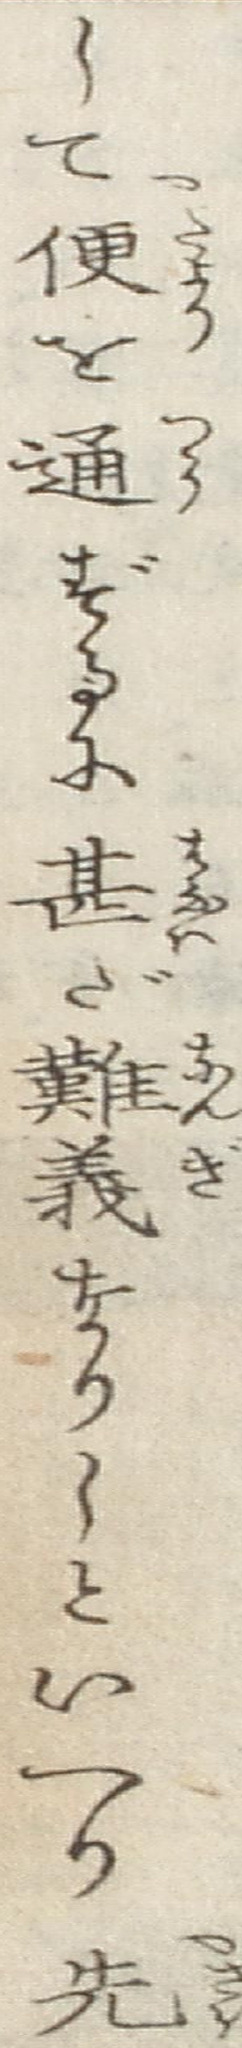して。便を通ずるに甚だ難義なりしといへり。先
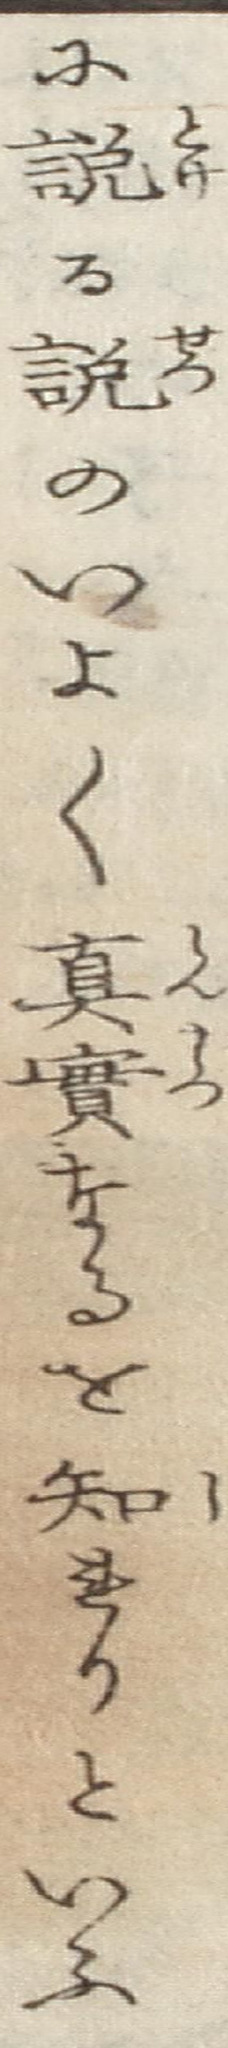に説る説のいよ〳〵真実なるを知れりといふ
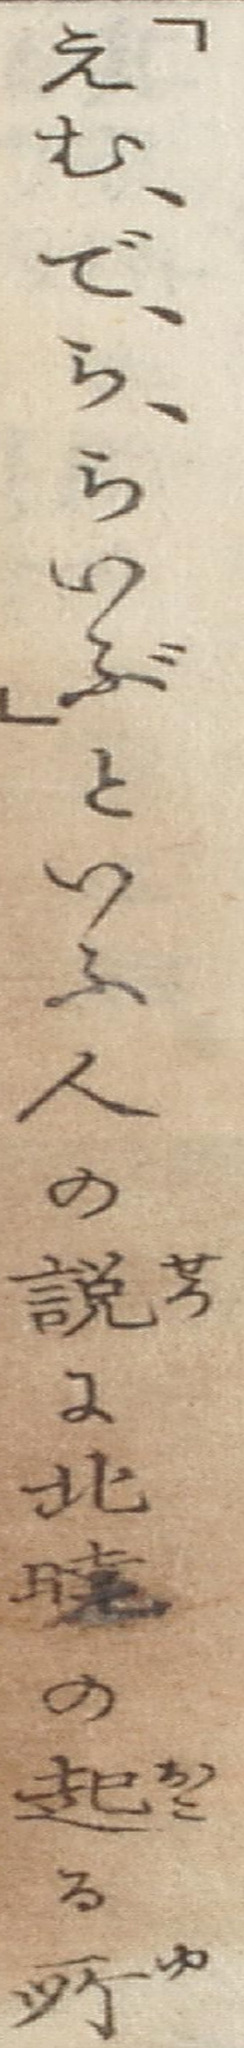「えむ、で、ら、らいぶ」といふ人の説に北暁の起る所
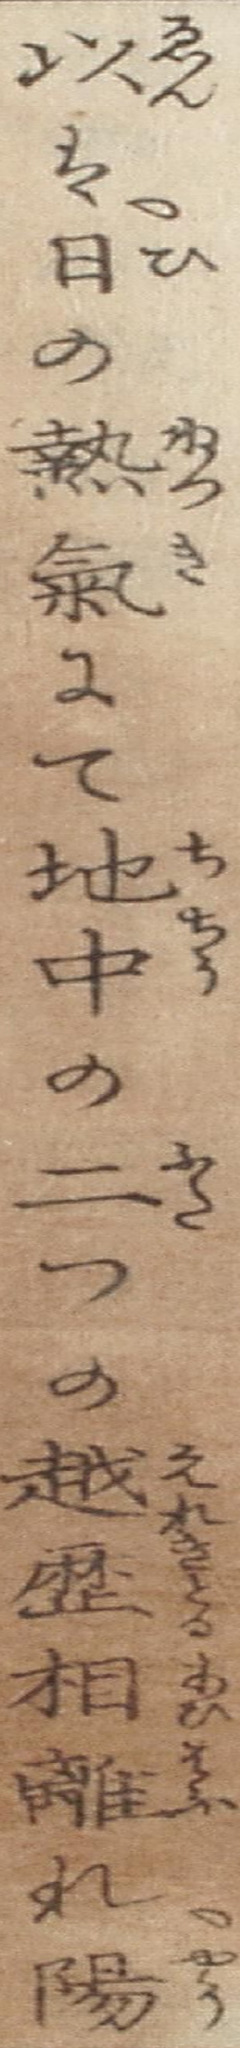以は。日の熱気にて地中の二つの越歴相離れ。陽
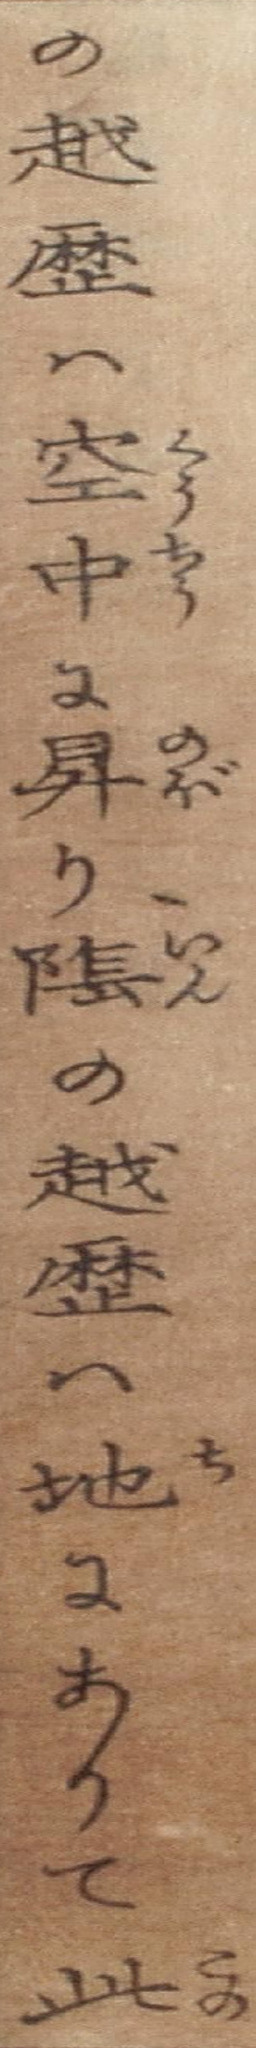の越歴は空中に昇り、陰の越歴は地にありて此
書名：変異辯　一名、天變地異拾遺　全
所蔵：東京大学地震研究所図書室 Earthquake Research Institute Library, The University of Tokyo, JAPAN
